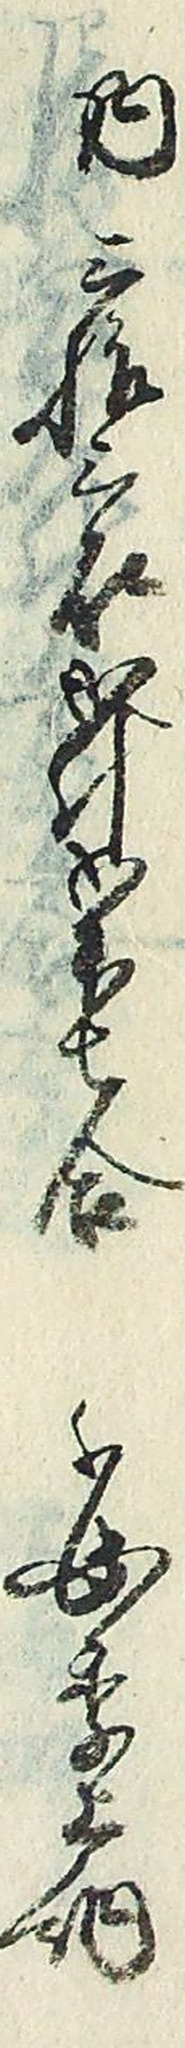内三拾三石弐斗弐升七合當季上納
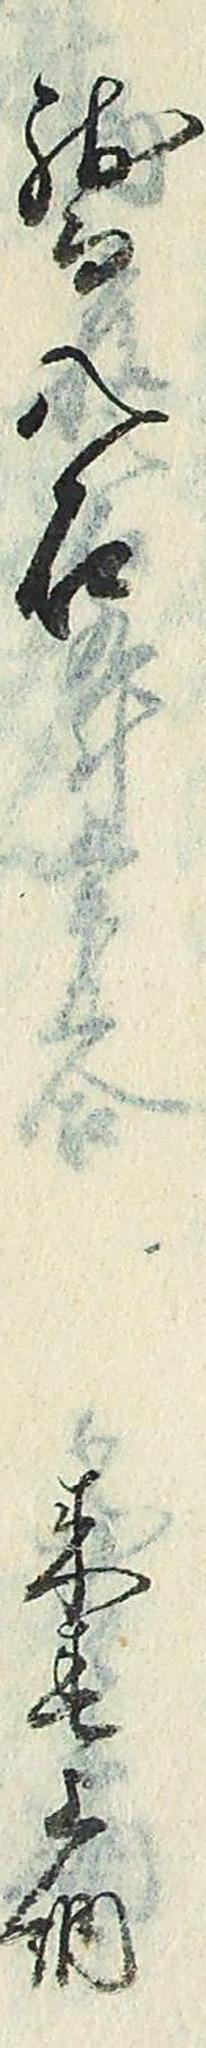残而八石来春上納
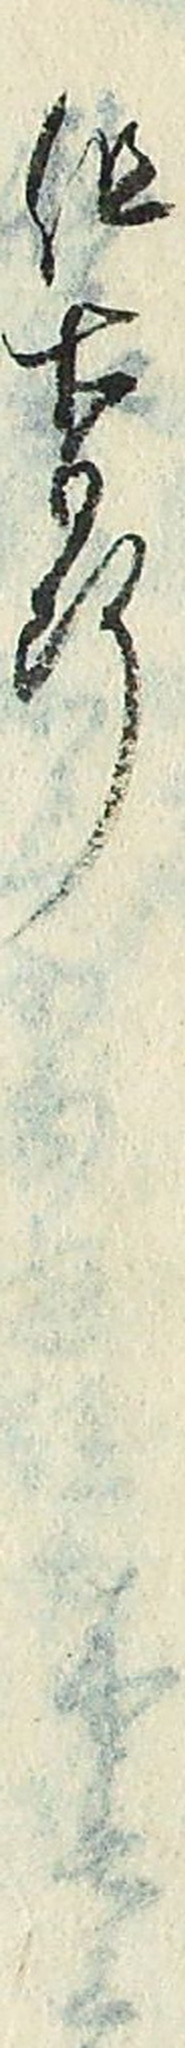但右同断
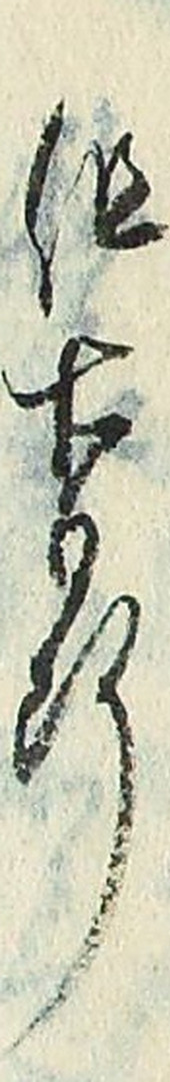但右同断

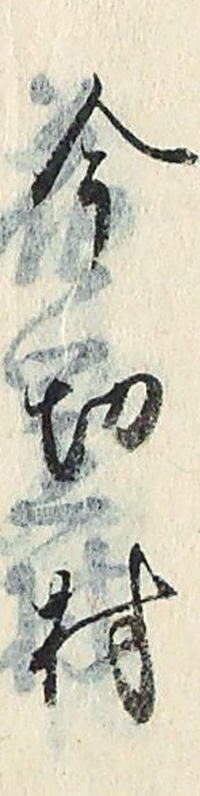今切村
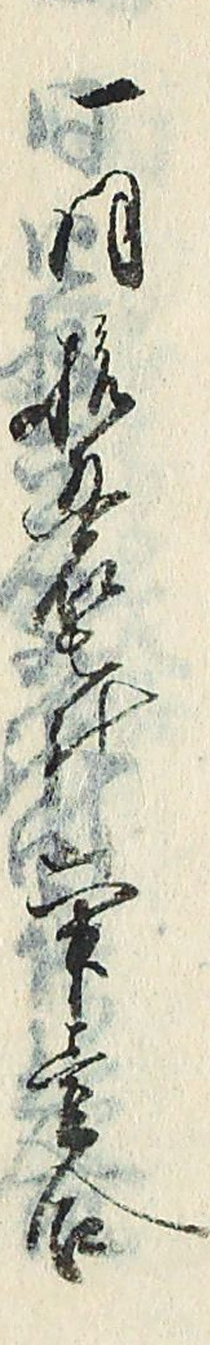一同拾五石七斗六升壹合
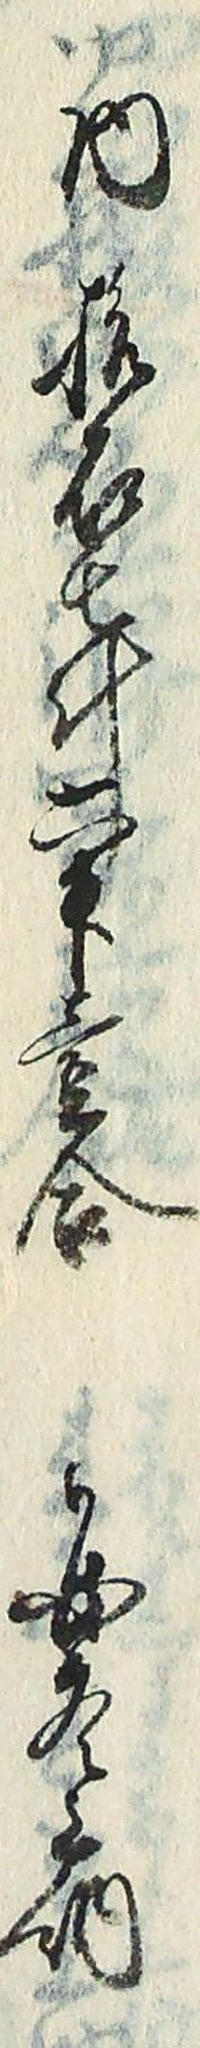内拾石七斗六升壹合當冬上納
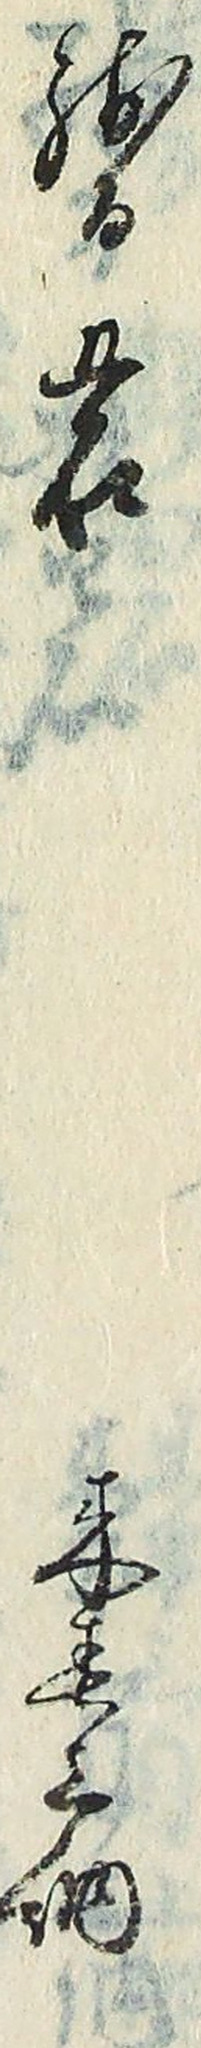残而五石来春上納
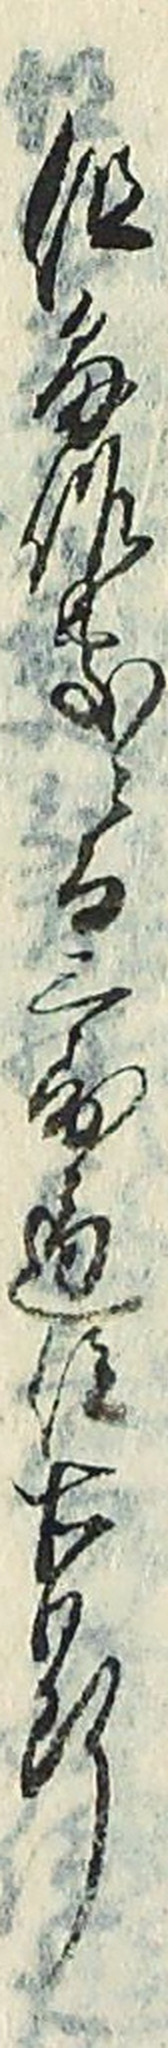但畠作處ニ而三歩通位右同断
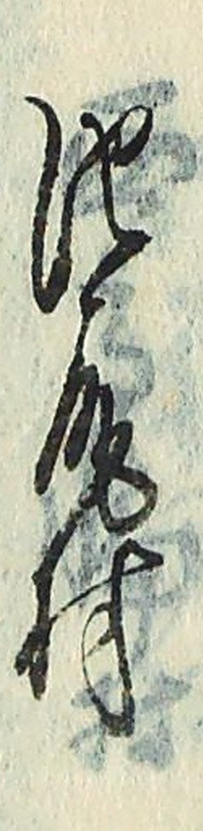池尻村
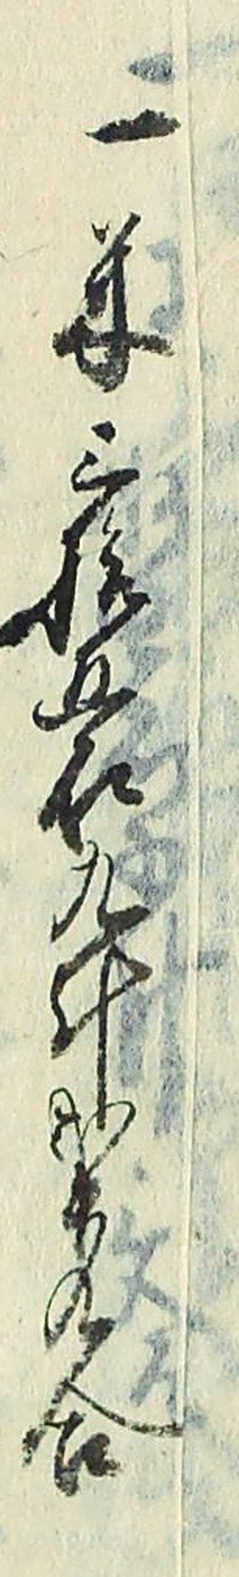一米三拾五石九斗弐升九合
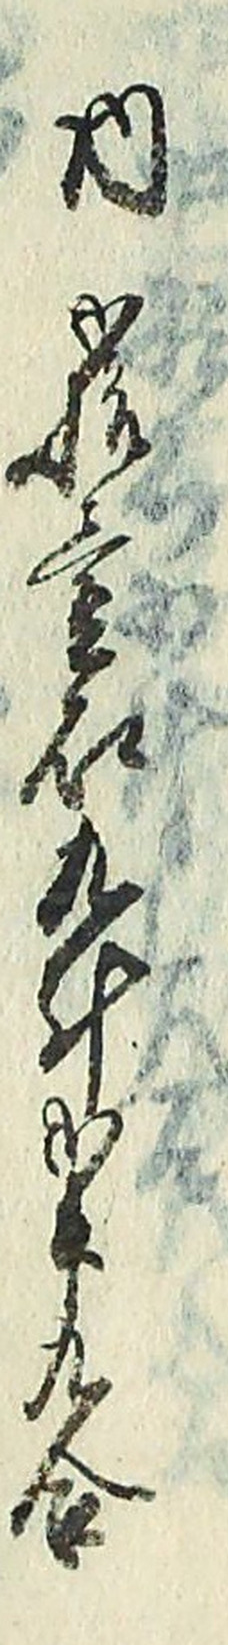一米三拾五石九斗弐升九合
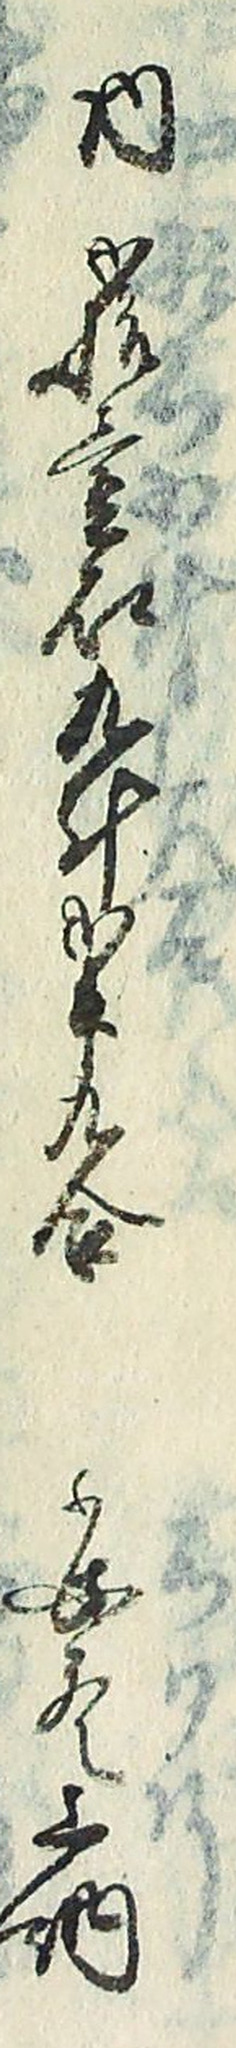内弐拾壹石九斗弐升九合當冬上納
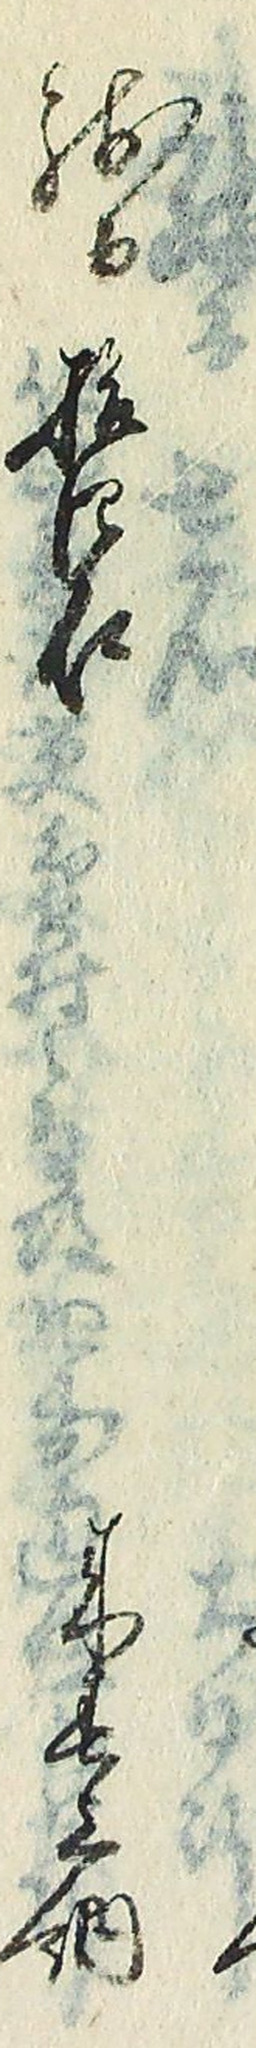残而拾四石来春上納
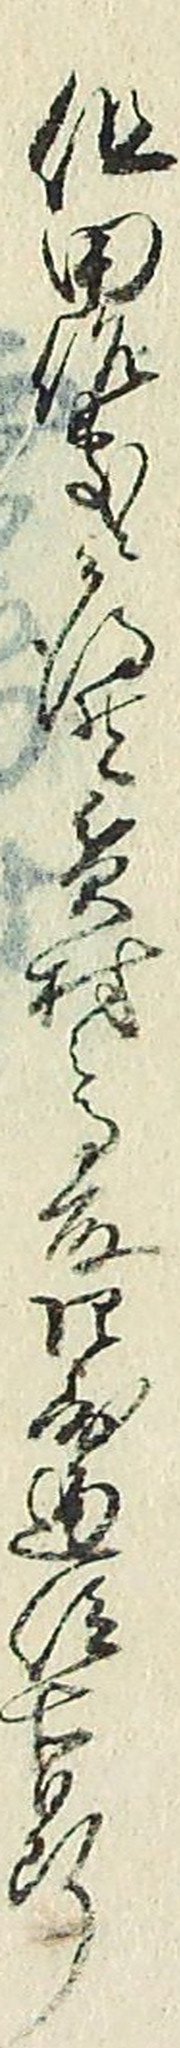但田作處ニ候得共貧村之事故四歩通位右同断
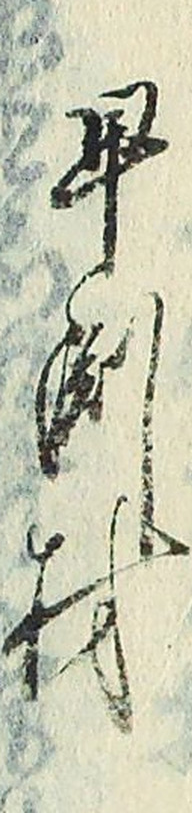早渕村
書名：諸御趣意書并御下知向之写
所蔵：鳴門教育大学 Naruto University of Education
